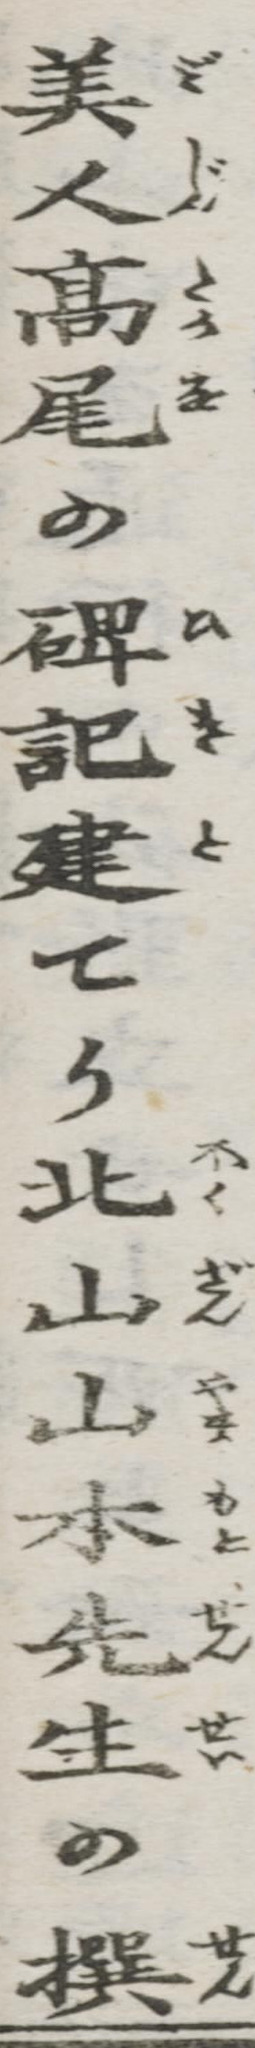美人高尾の碑記建てり北山山本先生の撰
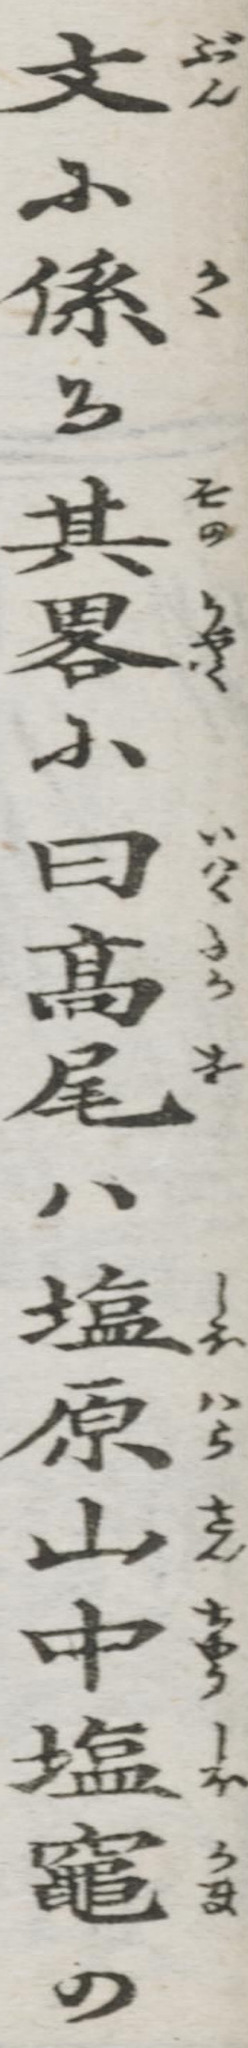文に係る其畧に曰高尾は塩原山中塩竈の
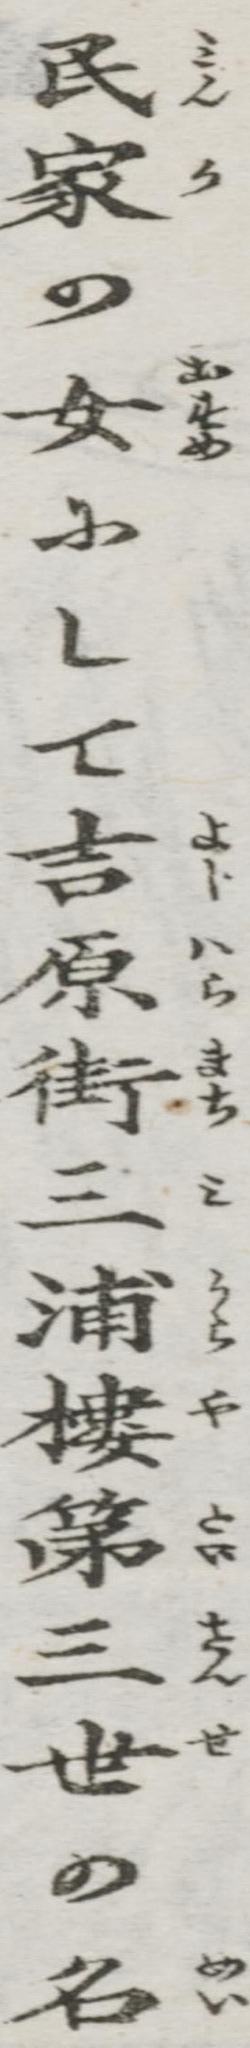民家の女にして吉原街三浦樓第三世の名
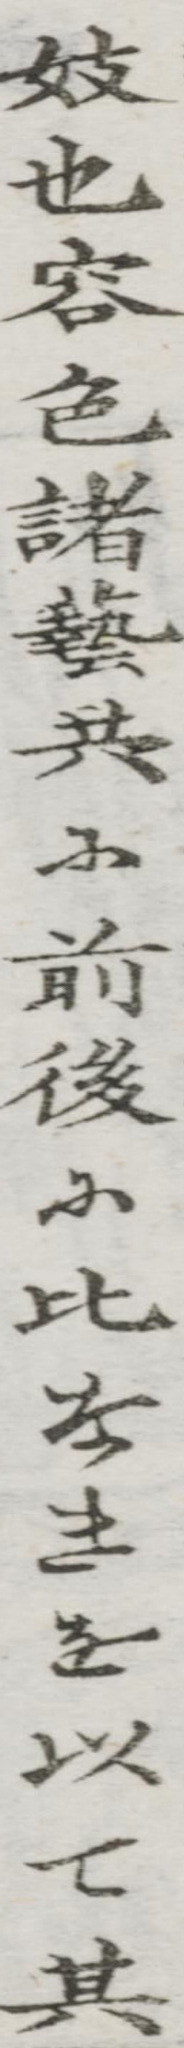妓也容色諸藝共に前後に比なきを以て其
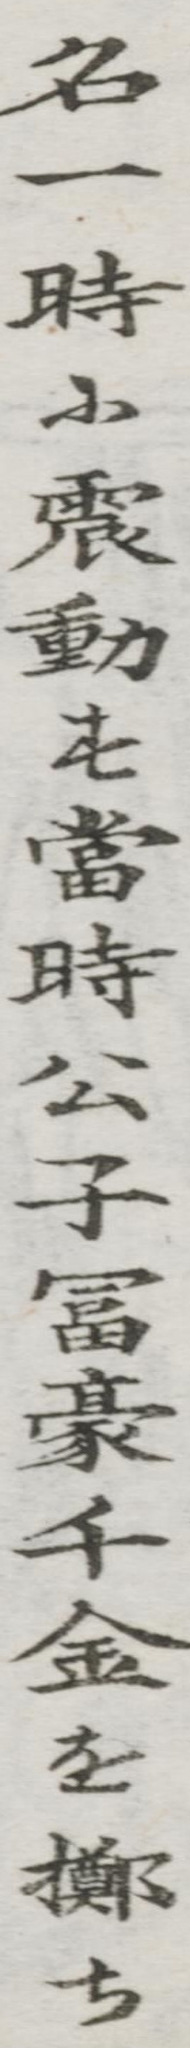名一時に震動す當時公子富豪千金を擲ち
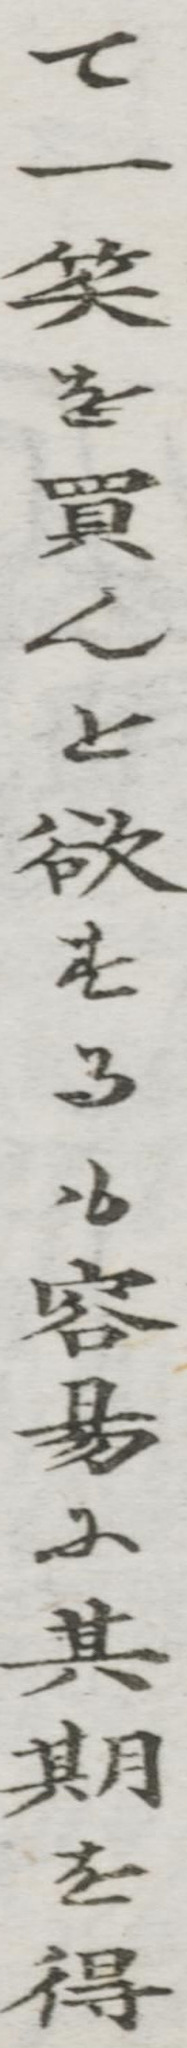て一笑を買んと欲するも容易に其期を得
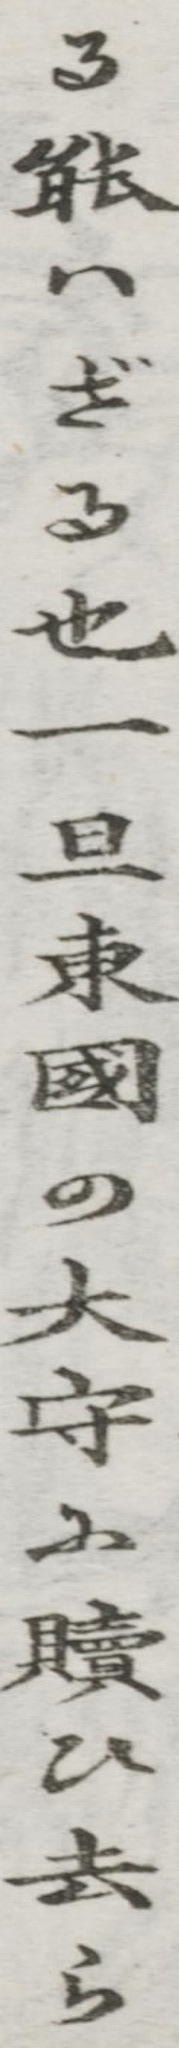る能はざる也一旦東國の太守に贖ひ去ら
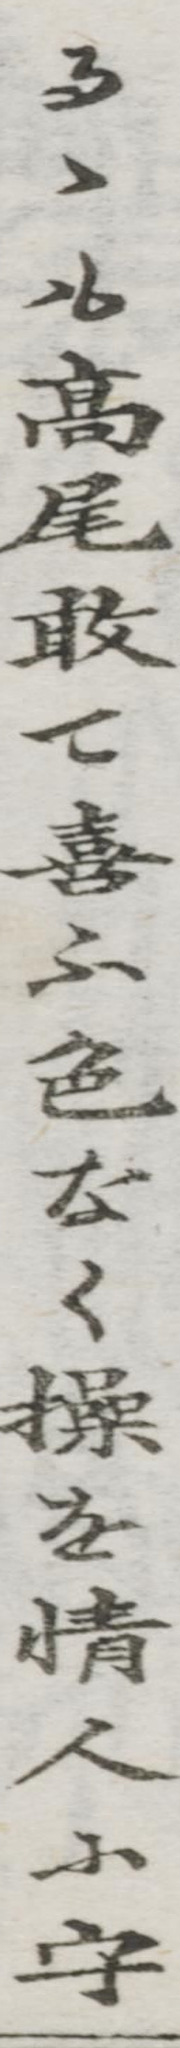るゝも高尾敢て喜ふ色なく操を情人に守
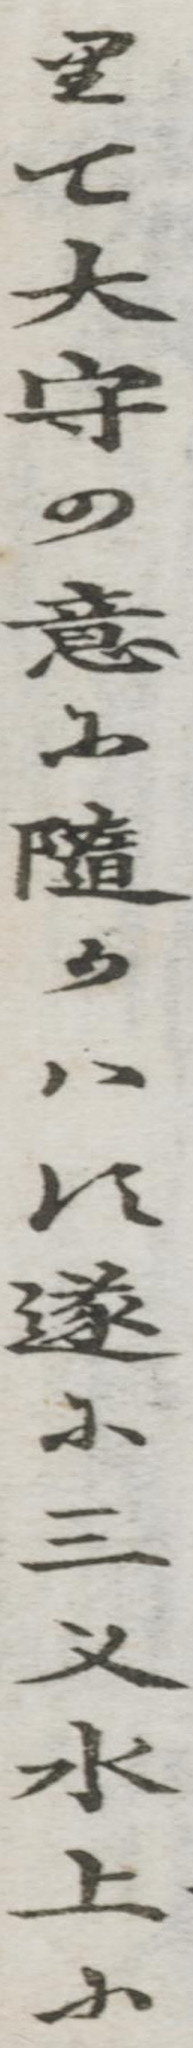りて太守の意に随かはす遂に三又水上に

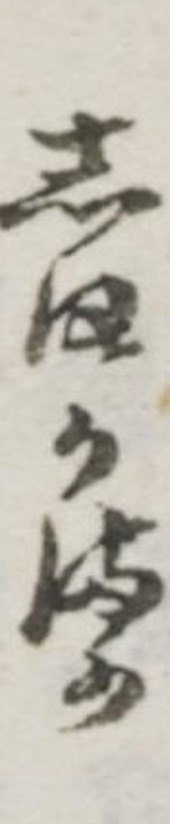しほかまに
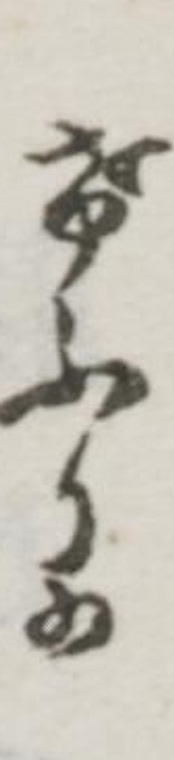けふりの
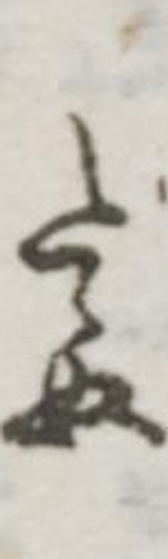たたぬ
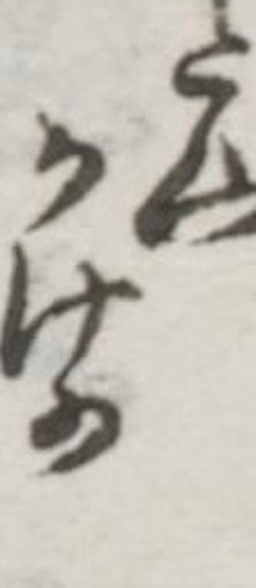かけの

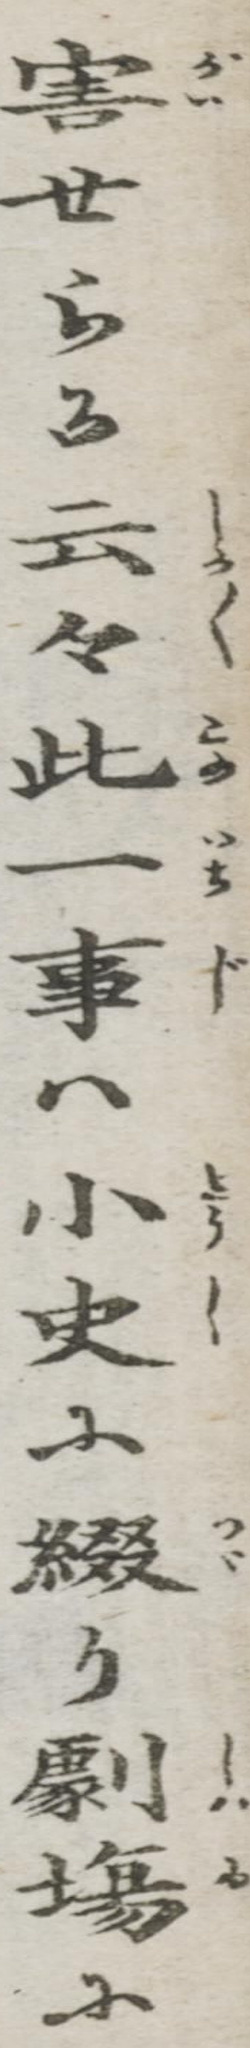害せらる云々此一事は小史に綴り劇場に
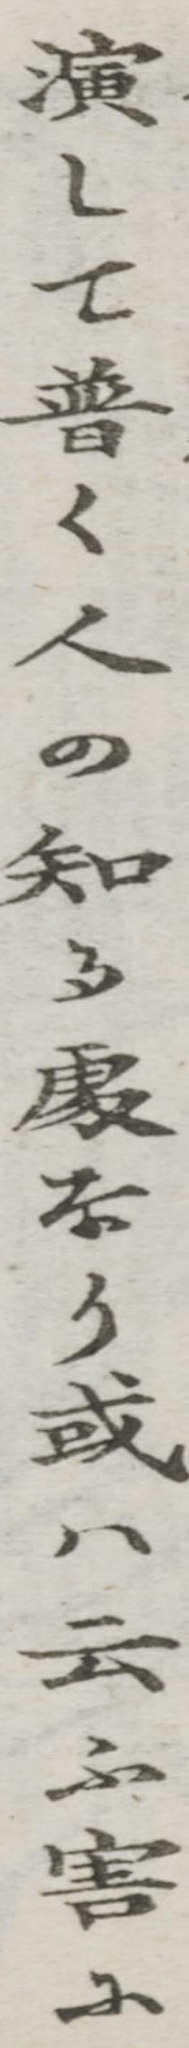演して普く人の知る処なり或は云ふ害に
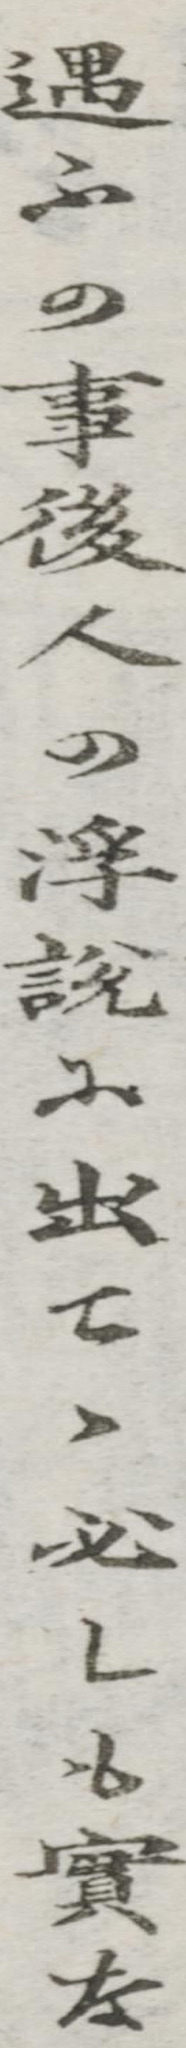遇ふの事後人の浮説に出てゝ必しも実な
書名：塩原繁昌記　全
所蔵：東京大学地震研究所図書室 Earthquake Research Institute Library, The University of Tokyo, JAPAN
